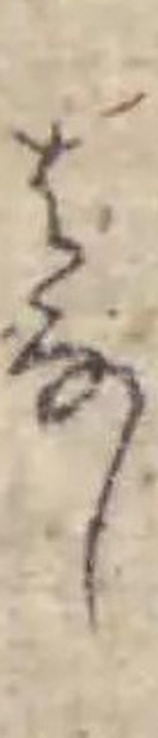はなし
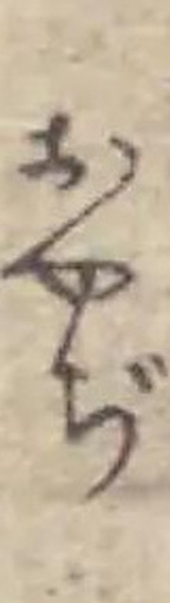おやぢ
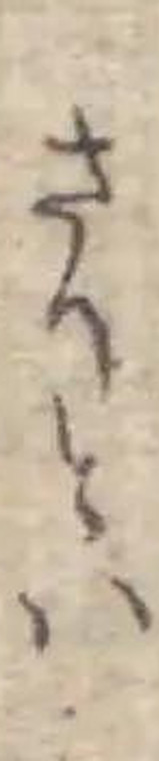さりとは
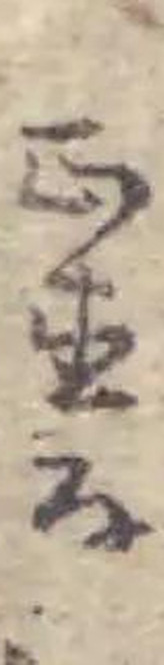正直な
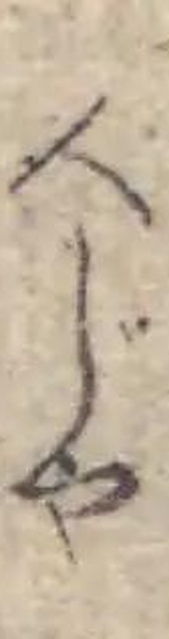人じや
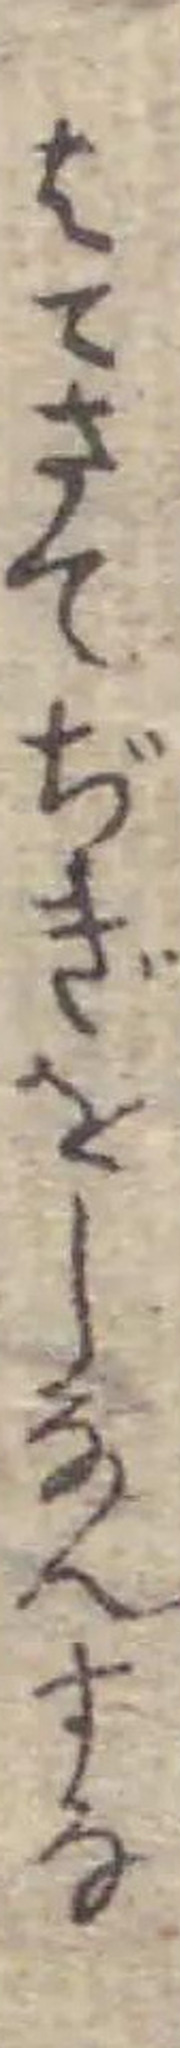はてさてじぎをしなんすな
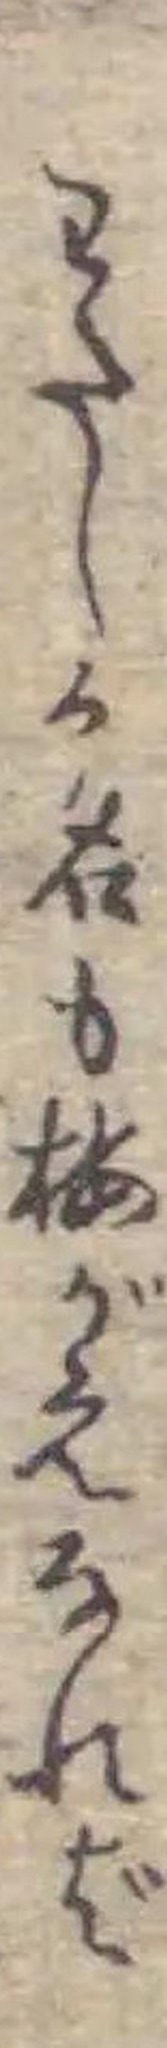わたしか名も梅がえなれば
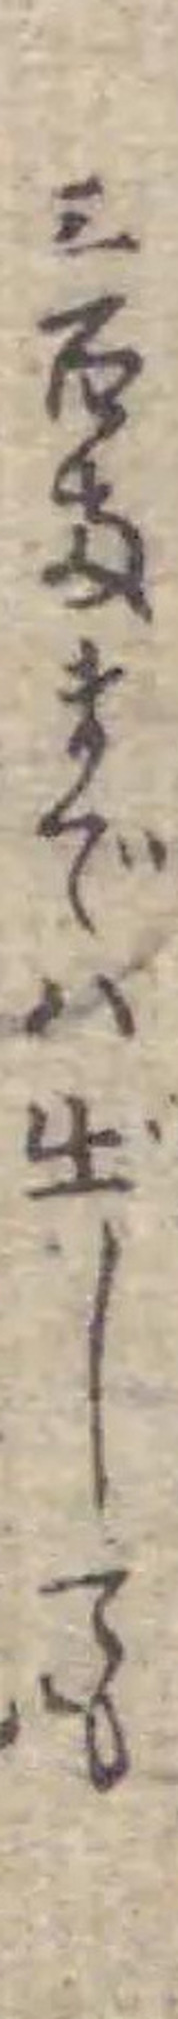三百両までは出しても
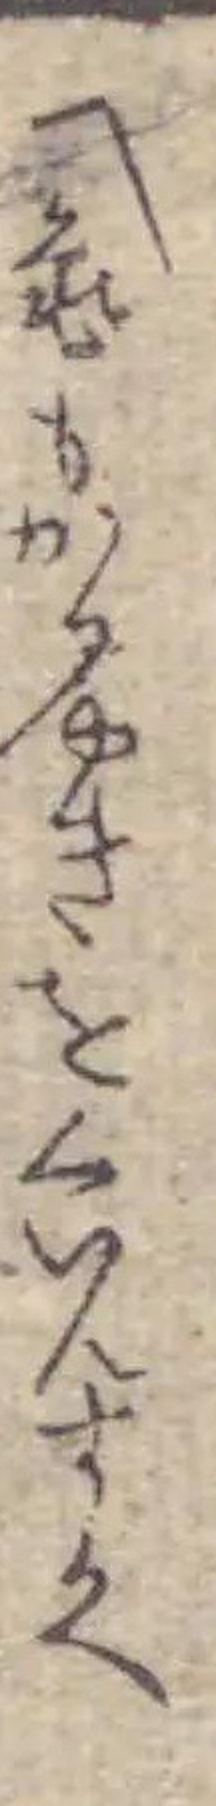〽亀もかるやきをくいんすかへ
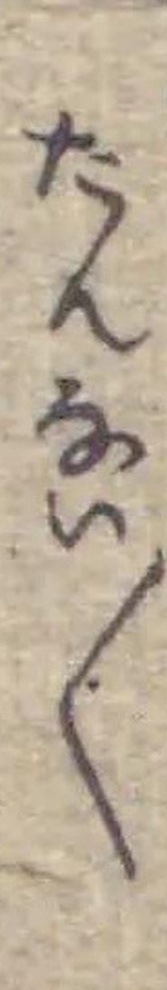たんない〳〵
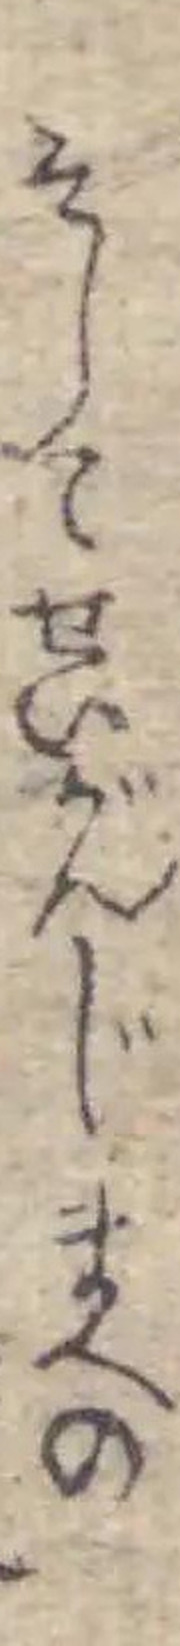そしてせいがんじまへの
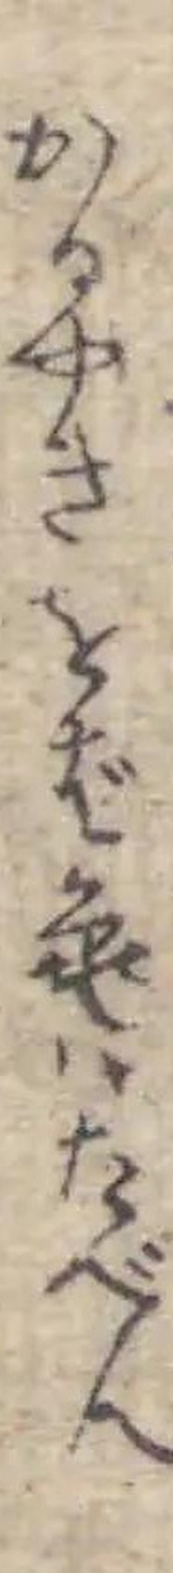かるやきをば亀はたべん
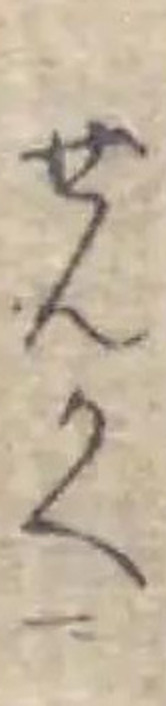せんかへ
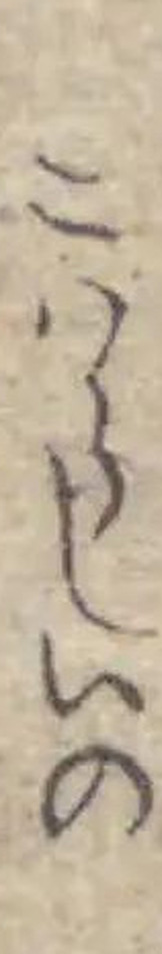こはらしいの

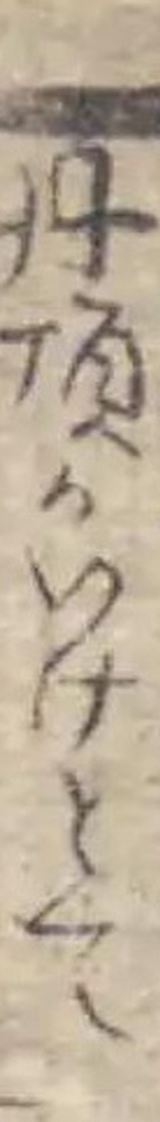丹頂かいけとて
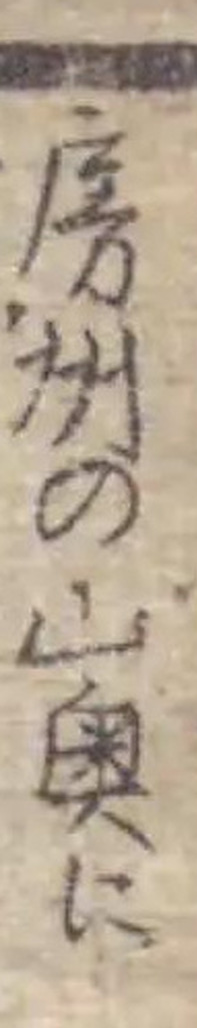房州の山奥に
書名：見立蓬莱 : 2巻
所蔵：国立国会図書館 National Diet Library, JAPAN
